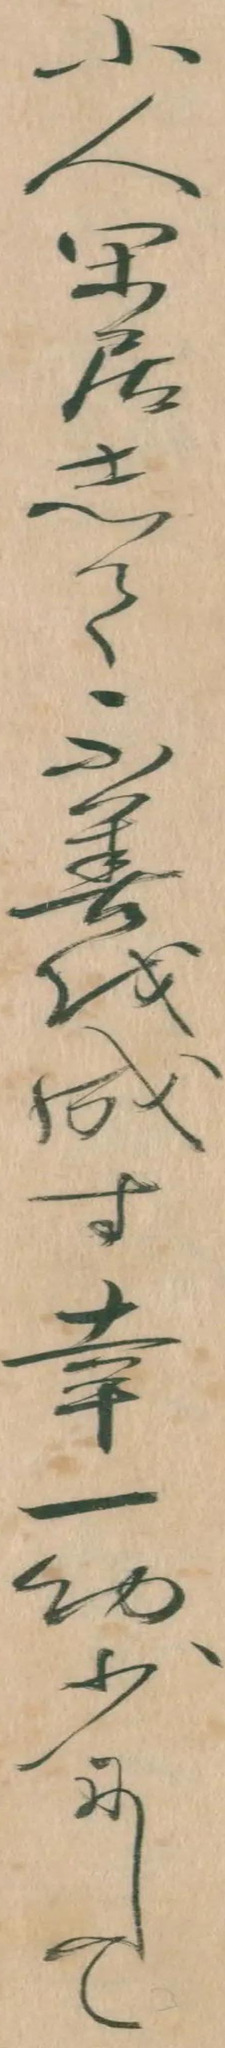小人閑居して不善をなす幸一幼少にして
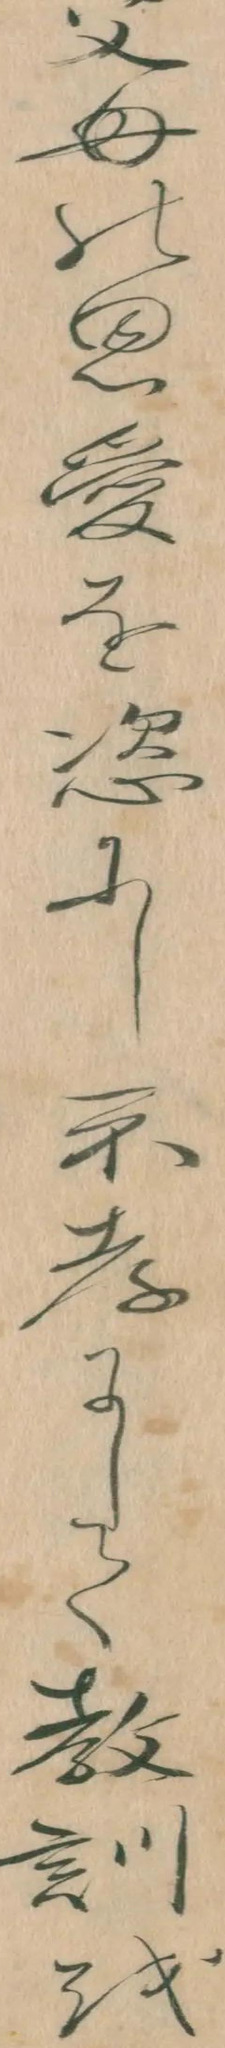父母の恩愛を恣にし不孝にして教訓を
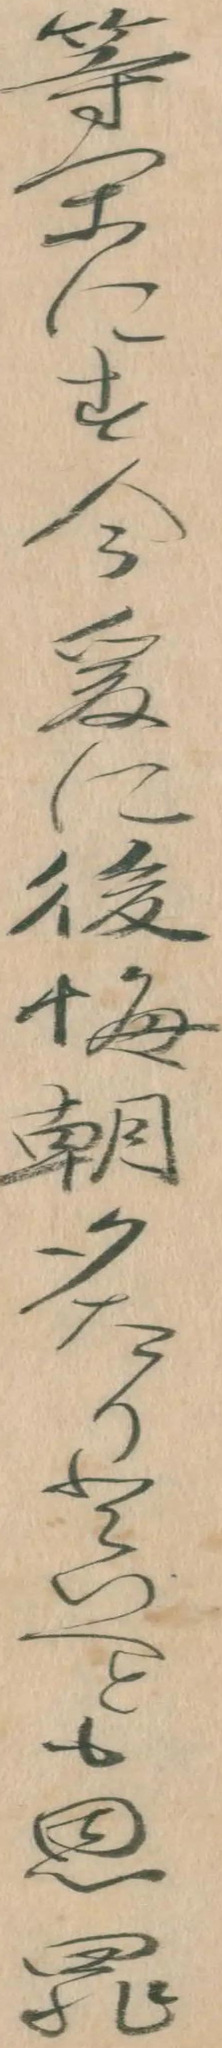等閑にす今爰に後悔朝夕たりといへとも恩罪
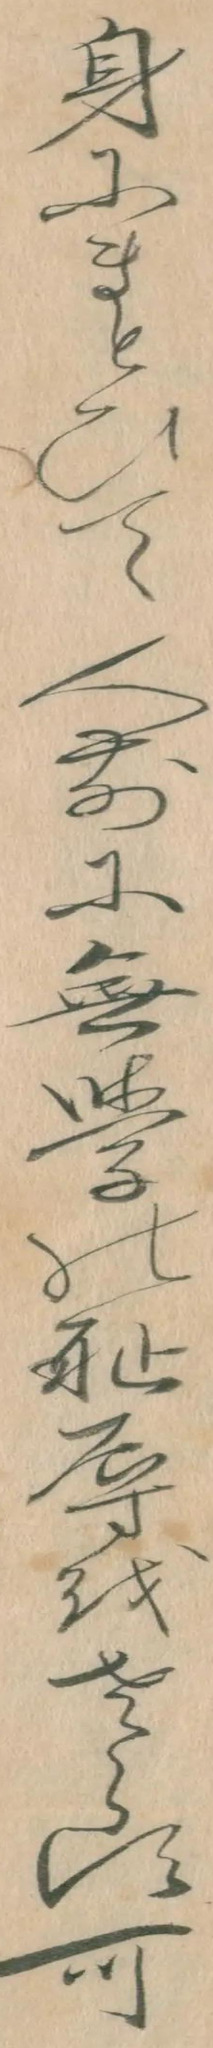身にまとひて人前に無学の恥辱をさらす可
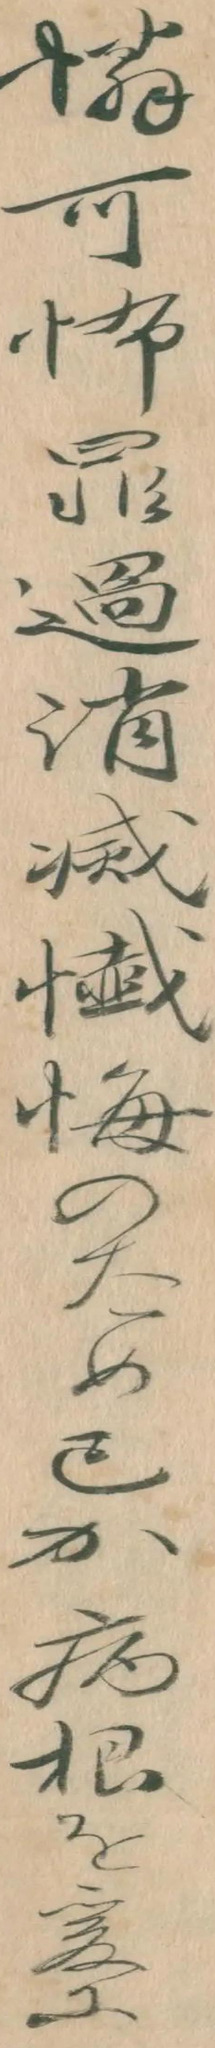憐可怖罪過消滅懴悔のため己か病根を爰に
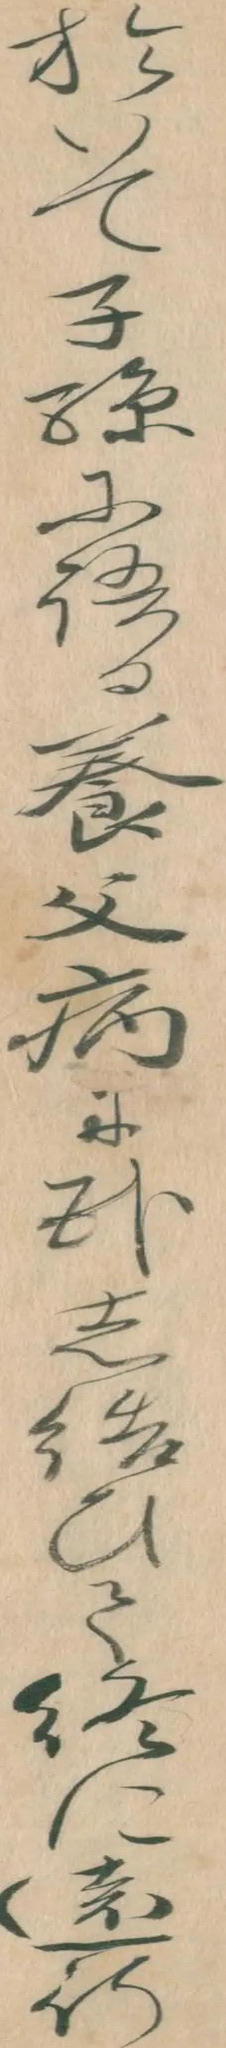於いて子孫に語る養父病に臥し給ひて終に遠行
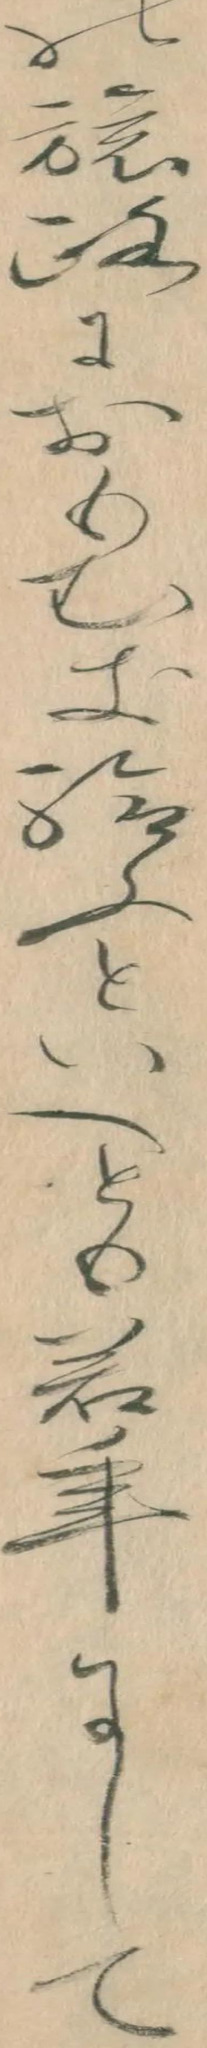の旅路におもむき給ふといへとも若年にして

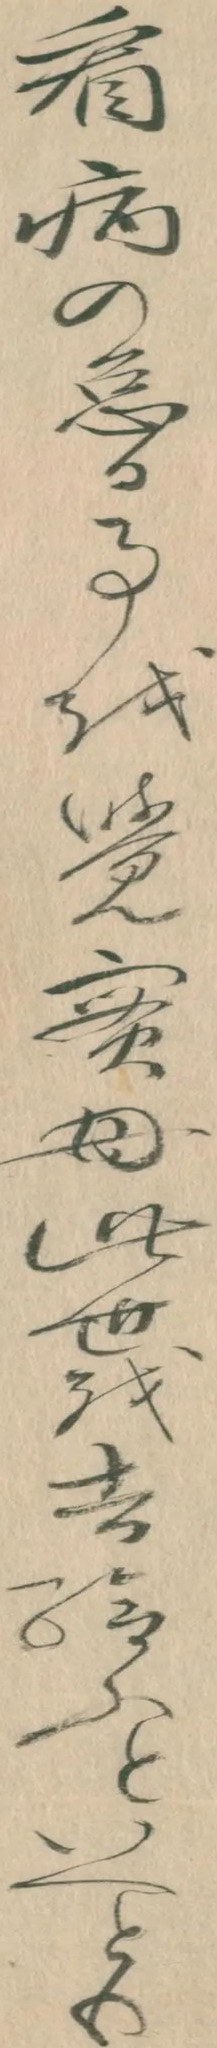看病の怠る事を覚実母此世を去給ふといへとも
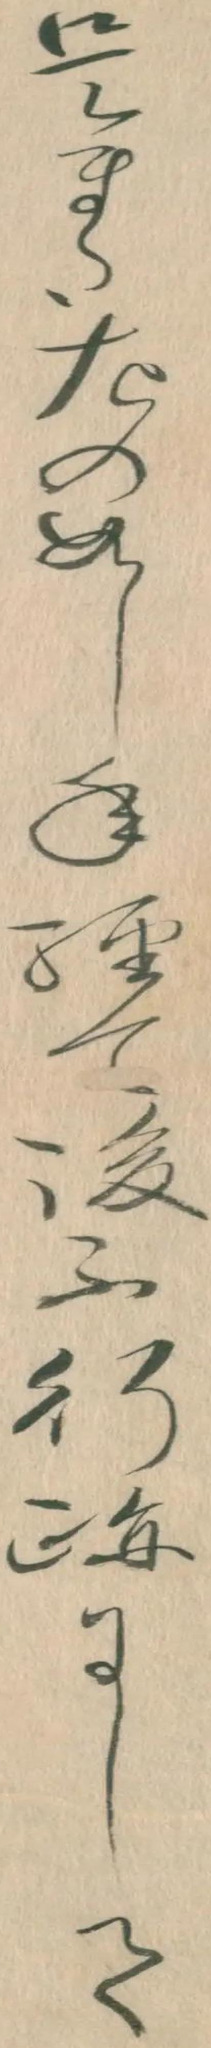是また左の如し年経て後不行跡にして
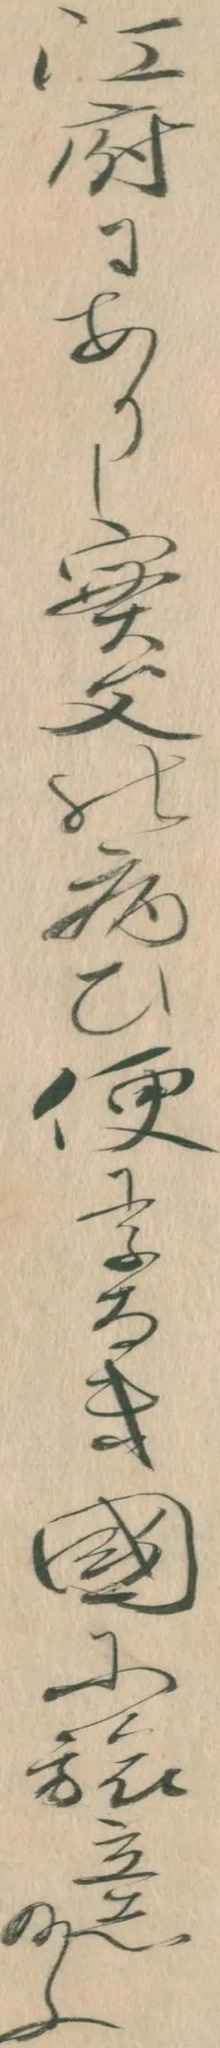江府にありし実父の病ひ便りなき国に旅立し給ふ
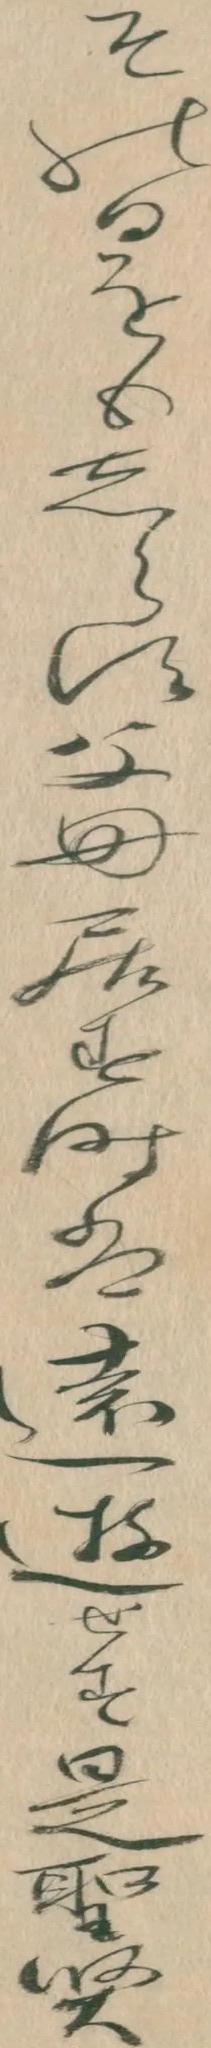その日をもしらす父母居す時は遠遊せす是聖賢
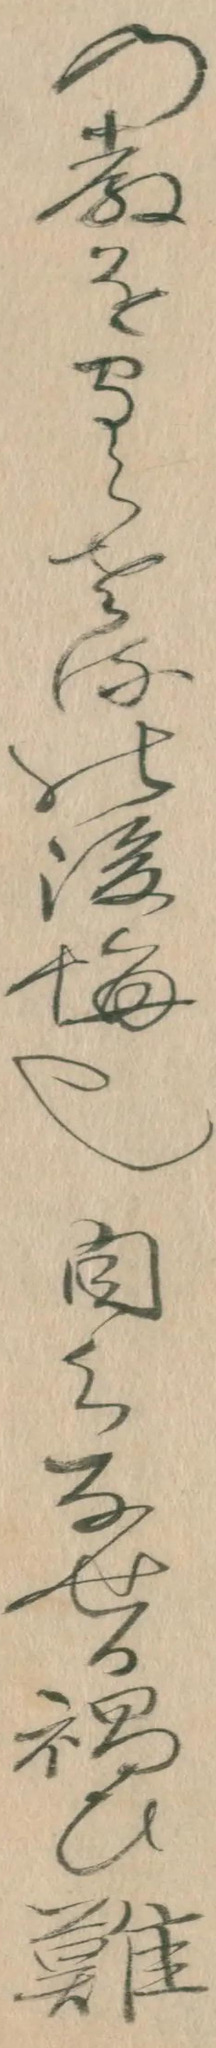の教を守らさるの後悔也自らなせる禍ひ難
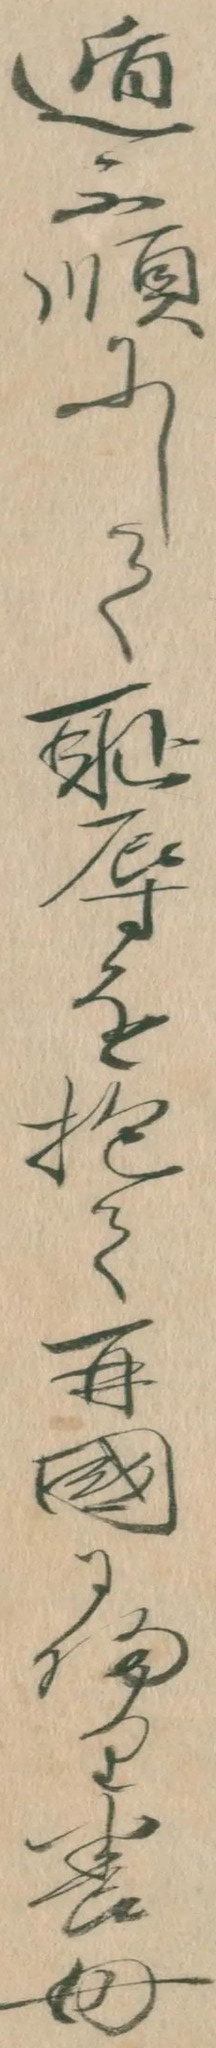遁不順にして恥辱を抱て再国に帰り養母
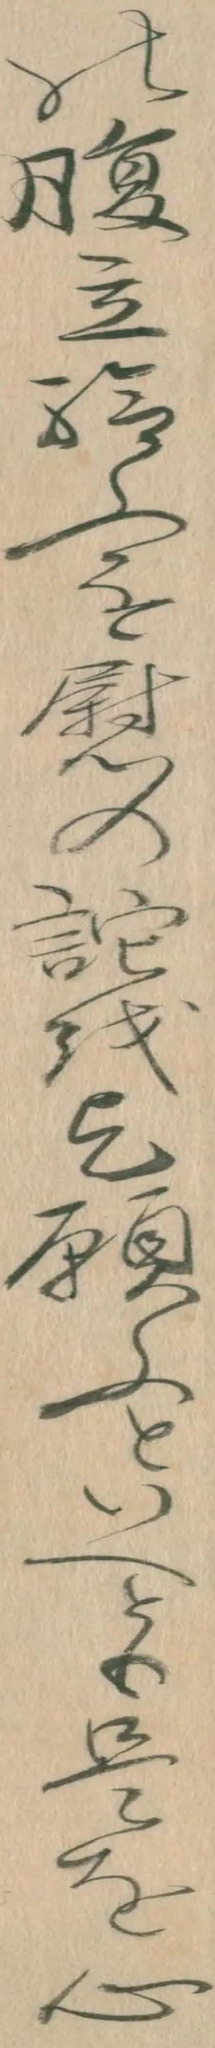の腹立給ふを慰の詫を乞願ふといへとも是を心
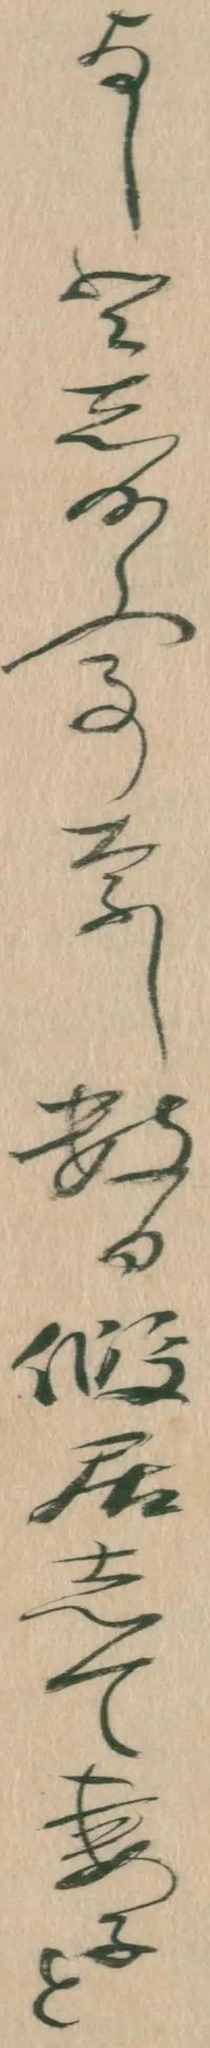よしとし給ふ事なし数日仮居して妻子と
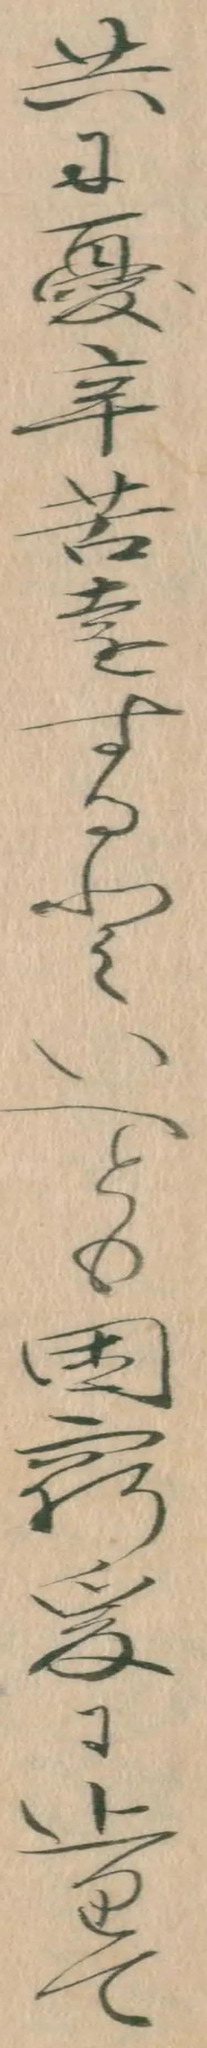共に憂辛苦をするといへとも困窮爰に止りて
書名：俗語之種. [1]
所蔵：国立国会図書館 National Diet Library, JAPAN
